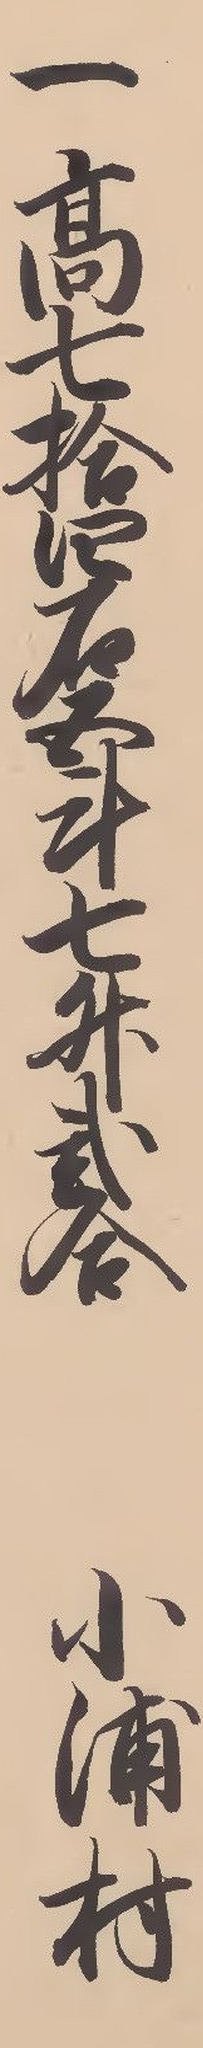一高七拾四石五斗七升弐合小浦村
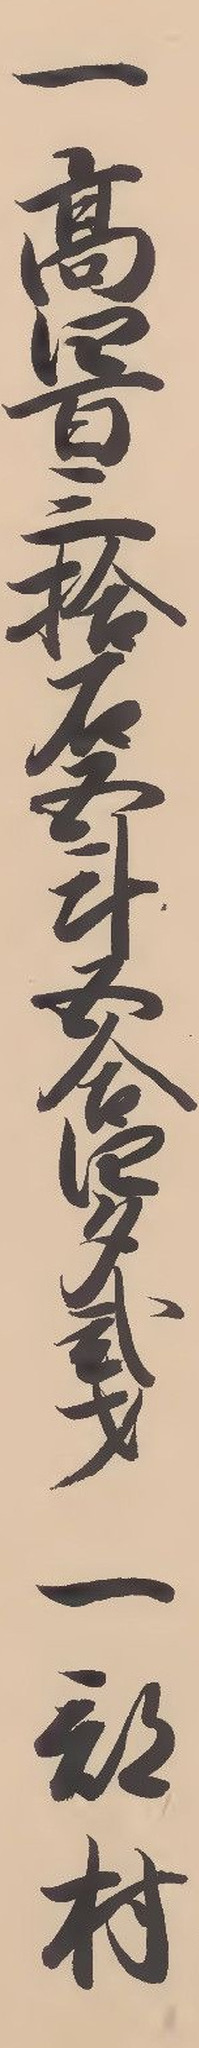一高四百三拾石五斗五合四勺弐才一部村
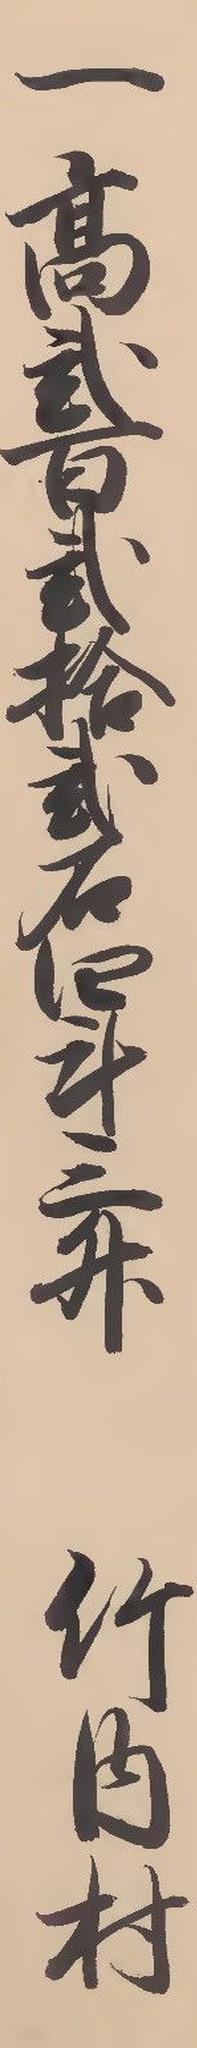一高弐百弐拾弐石四斗三升竹内村
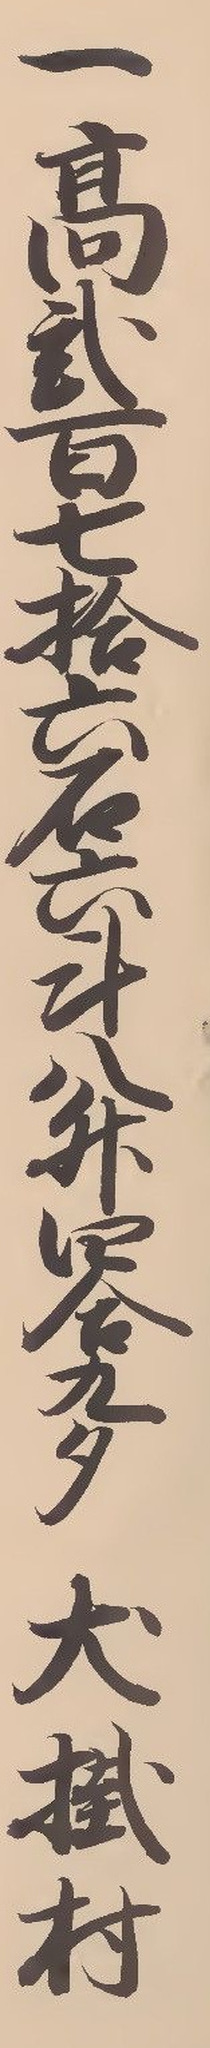一高弐百七拾六石六斗八升四合九勺犬掛村
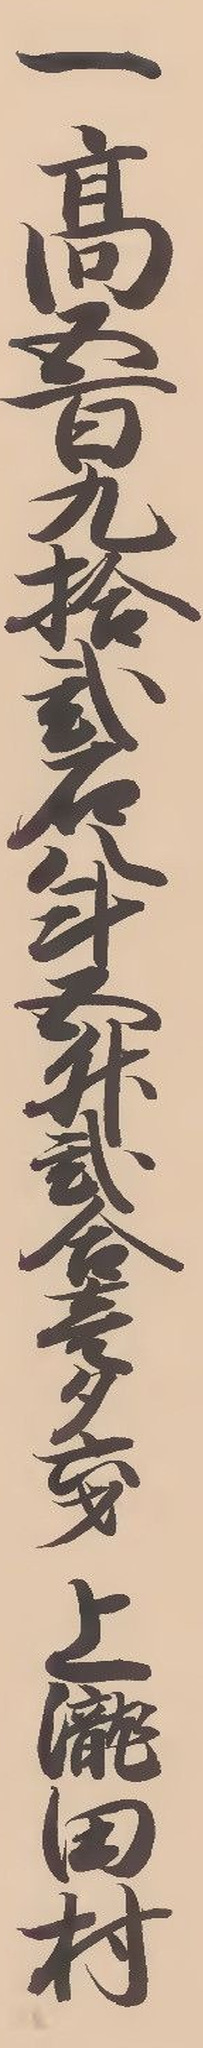一高五百九拾弐石八斗五升弐合壱勺六才上滝田村
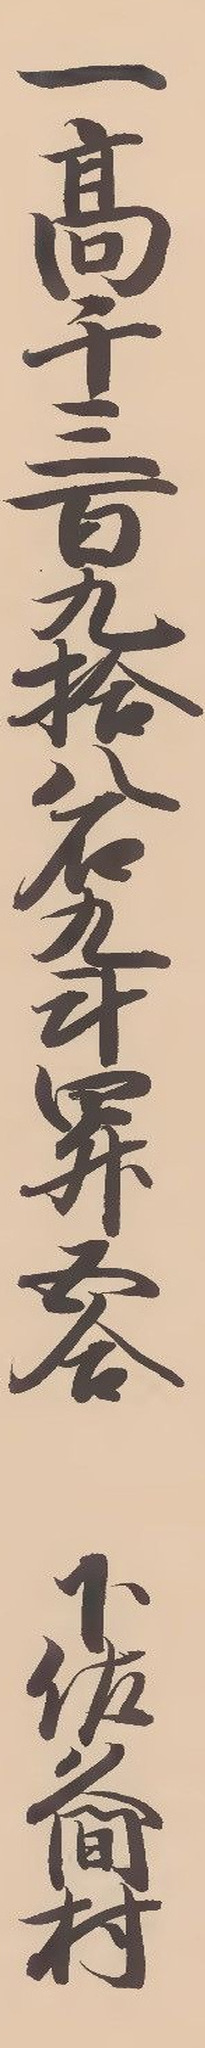一高千三百九拾八石九斗四升五合下佐久間村
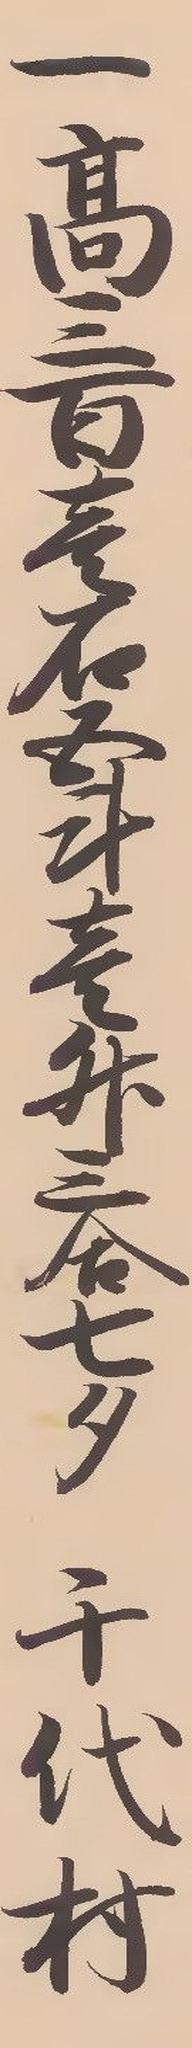一高三百壱石五斗壱升三合七勺千代村

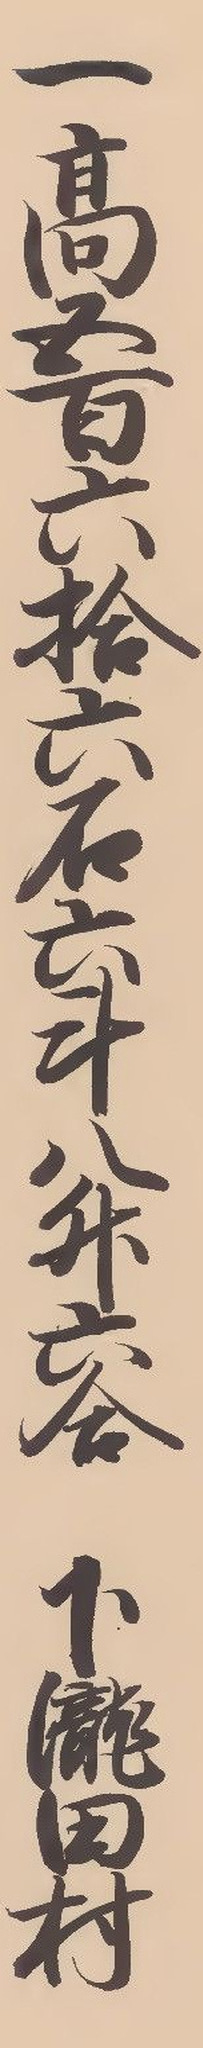一高五百六拾六石六斗八升六合下滝田村
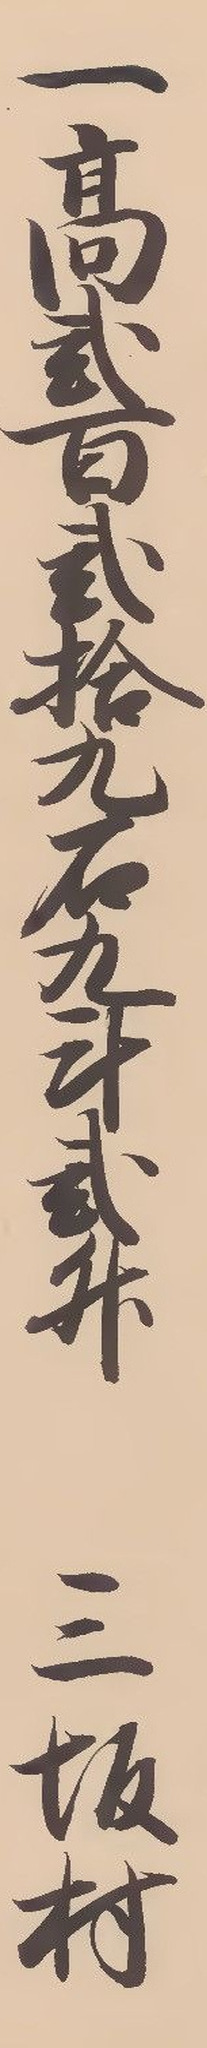一高弐百弐拾九石九斗弐升三坂村
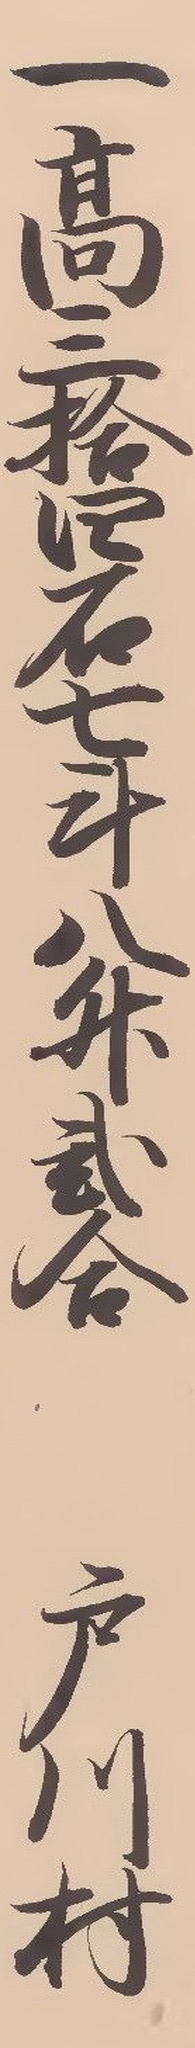一高三拾四石七斗八升弐合戸川村
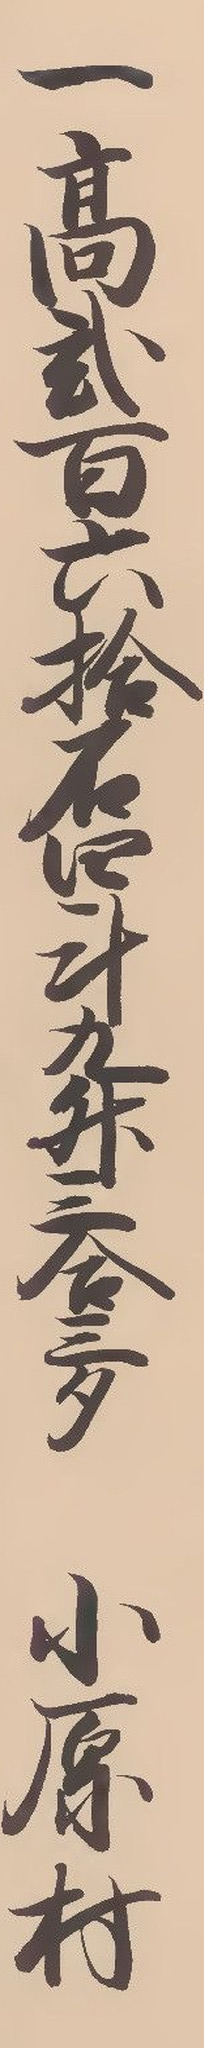一高弐百六拾石四斗九升三合三勺小原村
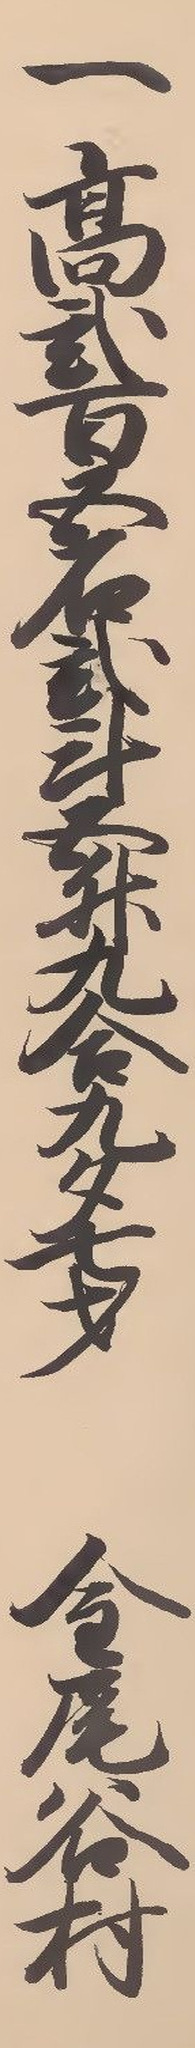一高弐百五石弐斗五升九合九勺七才金尾谷村
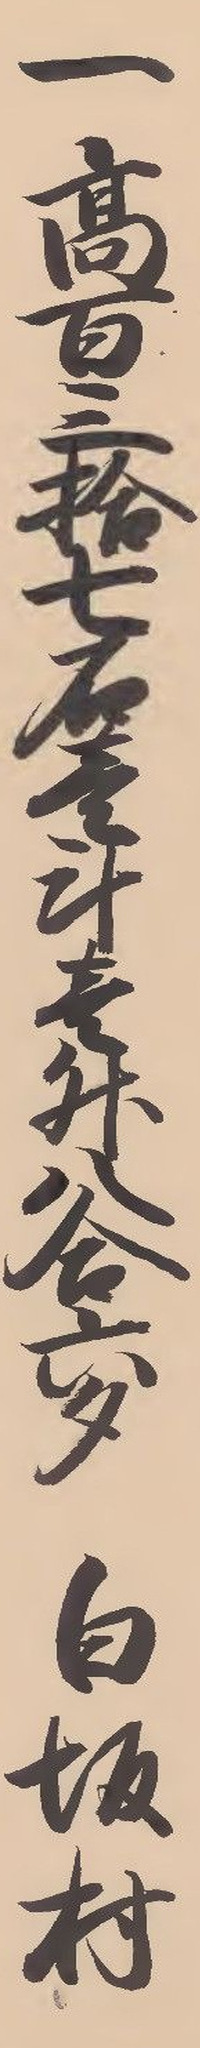一高百三拾七石壱斗壱升八合六勺白坂村
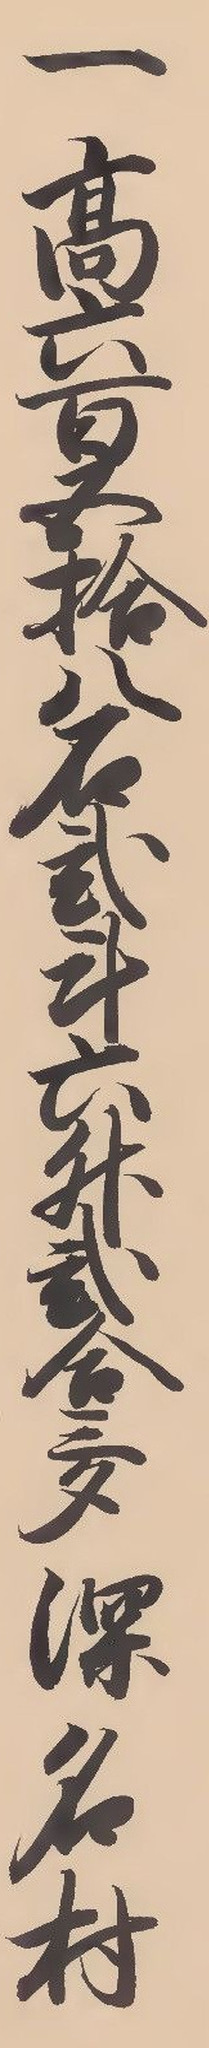一高六百五拾八石弐斗六升弐合三勺深名村
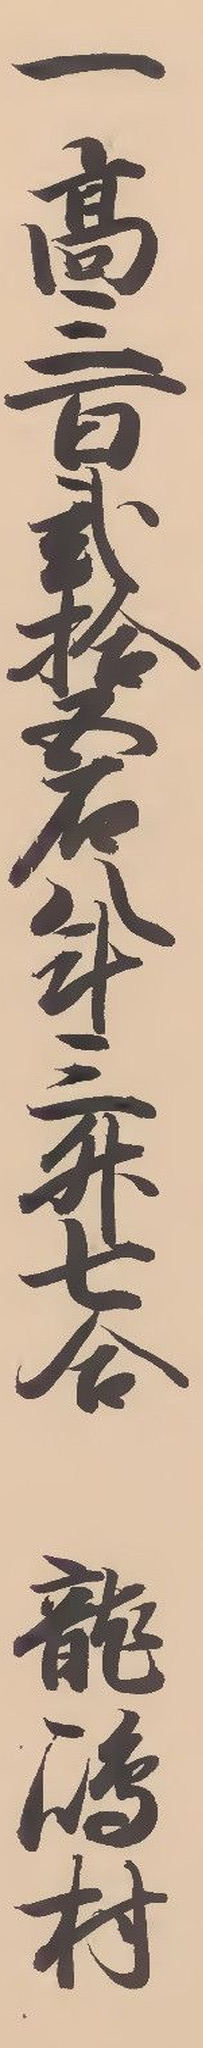一高三百弐拾五石八斗三升七合竜島村

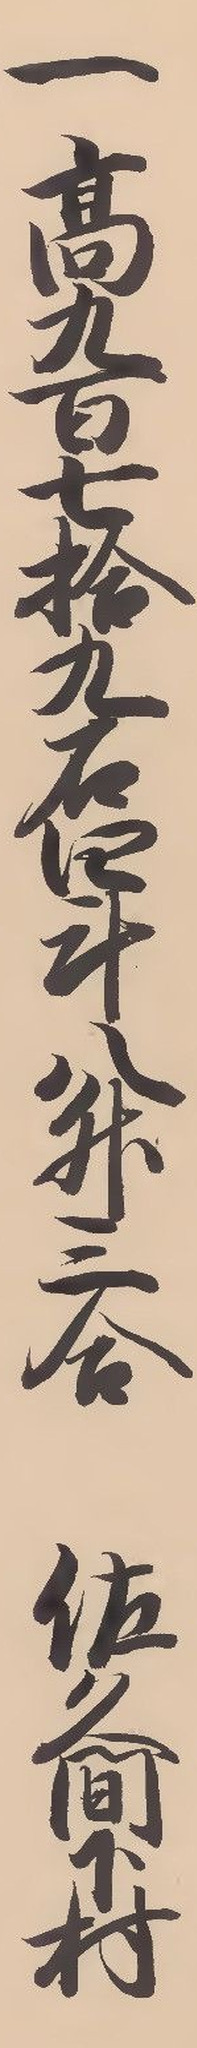一高九百七拾九石四斗八升三合佐久間下村
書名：安房国郷帳
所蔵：国立公文書館 National Archives of Japan
